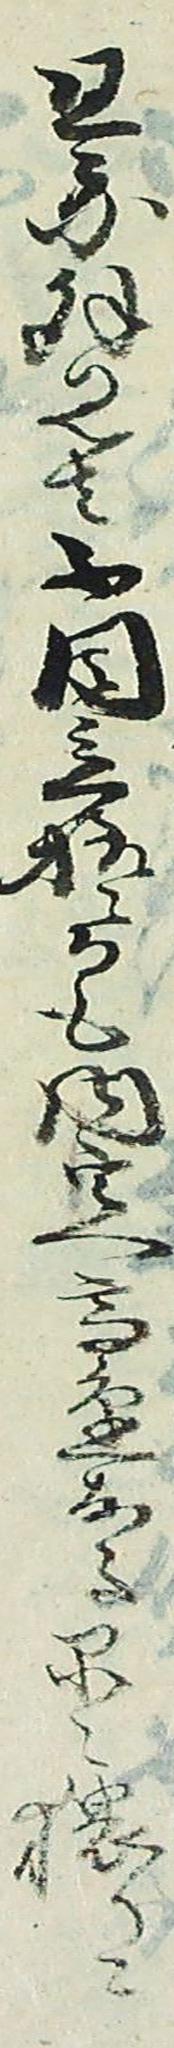且亦外見は不目立様に而も内実高金なる品々猥りに
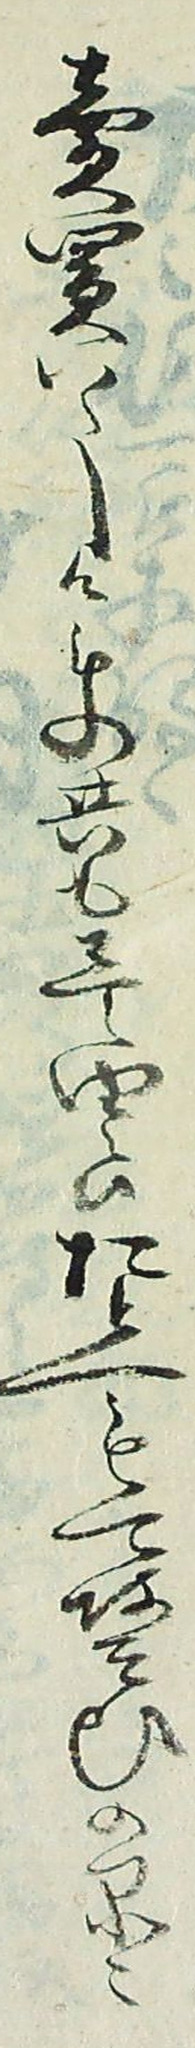売買いたし候もの共も有之由に候たとへもてあそひの品々
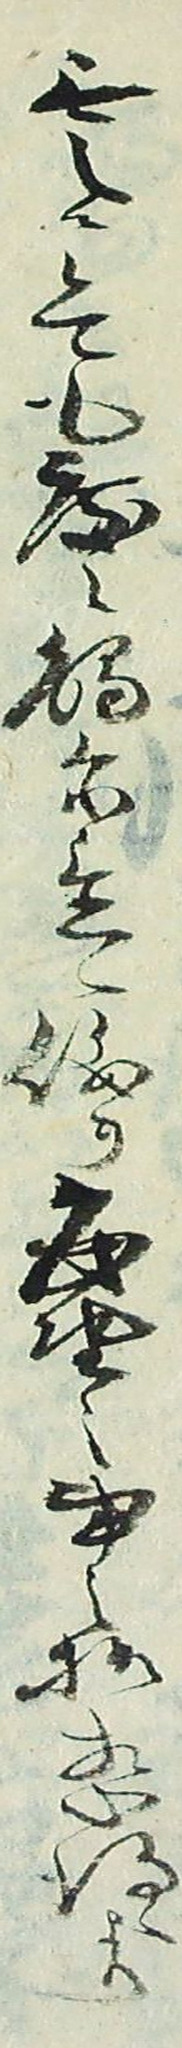無之に候ても度々触示置候儀を当坐之事之様相心得候より
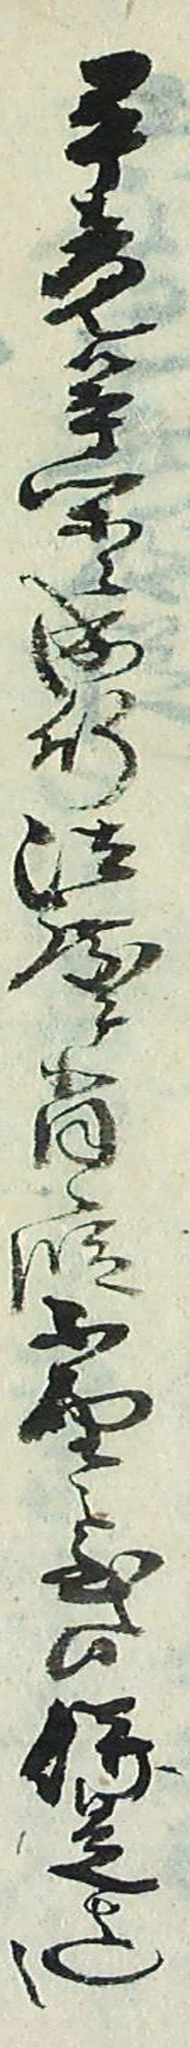畢竟等閑に成行法度に背候段不届之至に候併是迄之
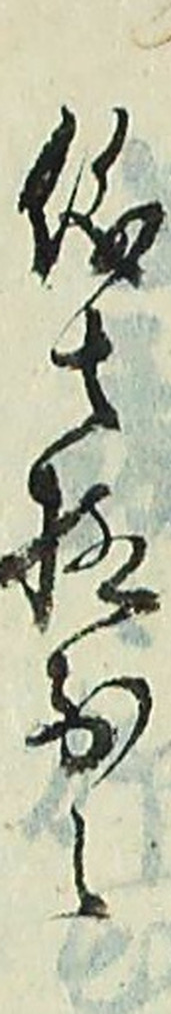儀は格別之
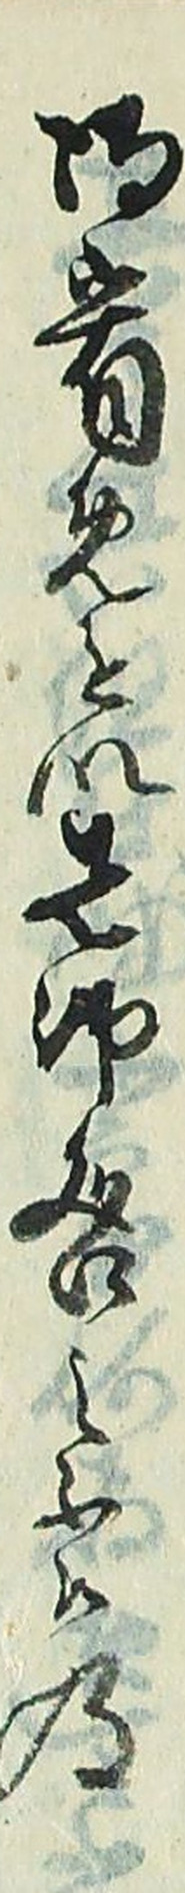御宥免を以先御咎之不被及
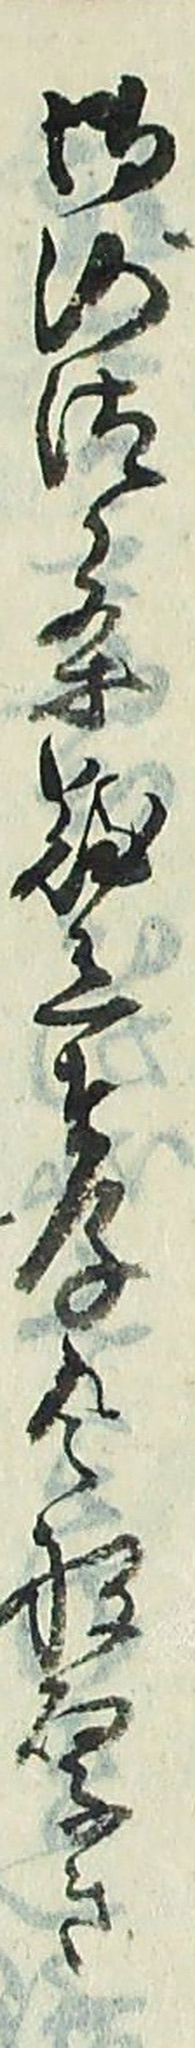御沙汰候条難有奉存今般厚き
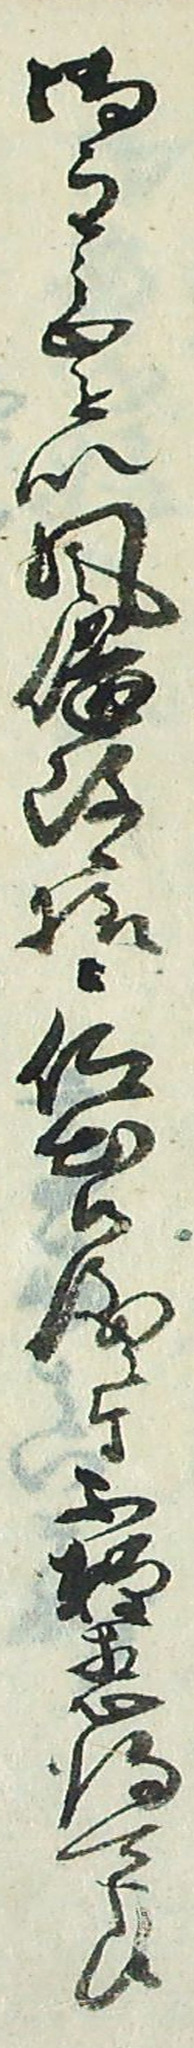御主意を以風俗改候様被仰出候儀に付不軽相心得可申候
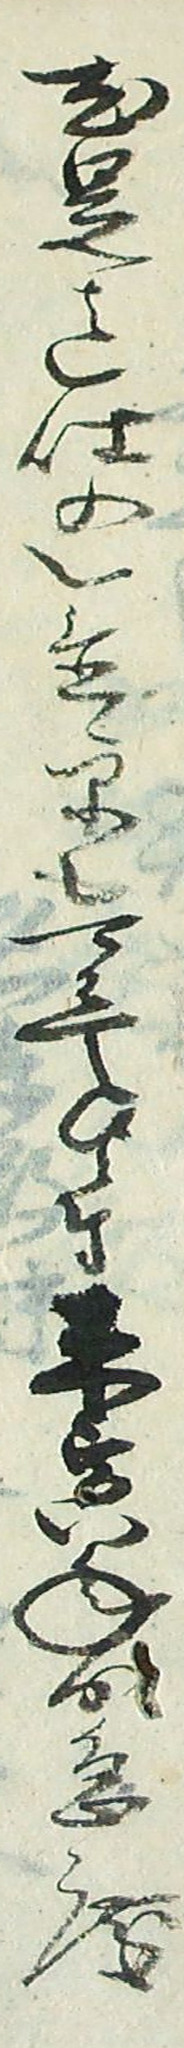尤是迄仕込置候品も可有之候に付来寅年ゟ急度

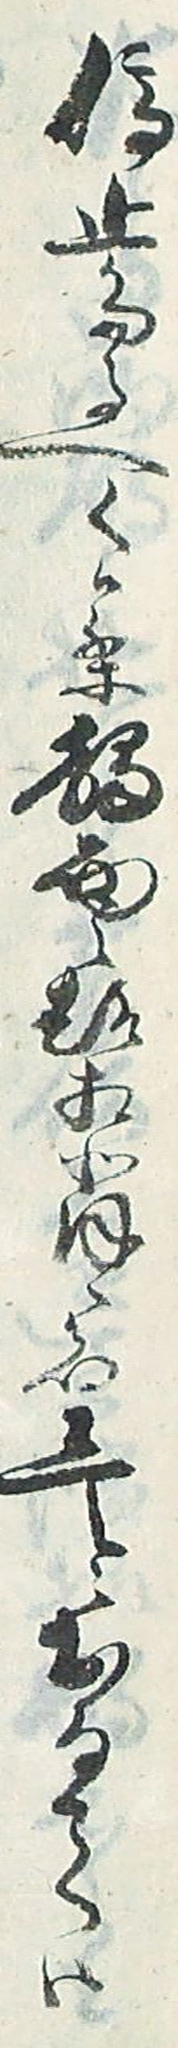停止たるへく候条触面之趣相背候者有之におゐては
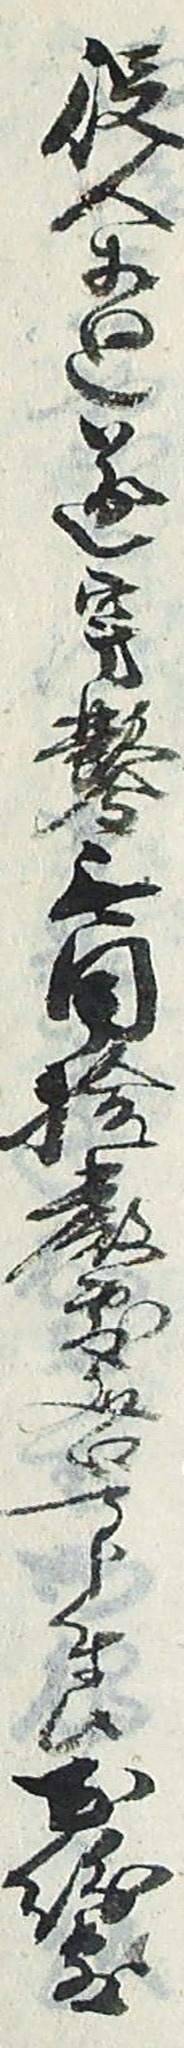役人相廻遂穿鑿無用捨厳敷咎可申付候尤紛敷
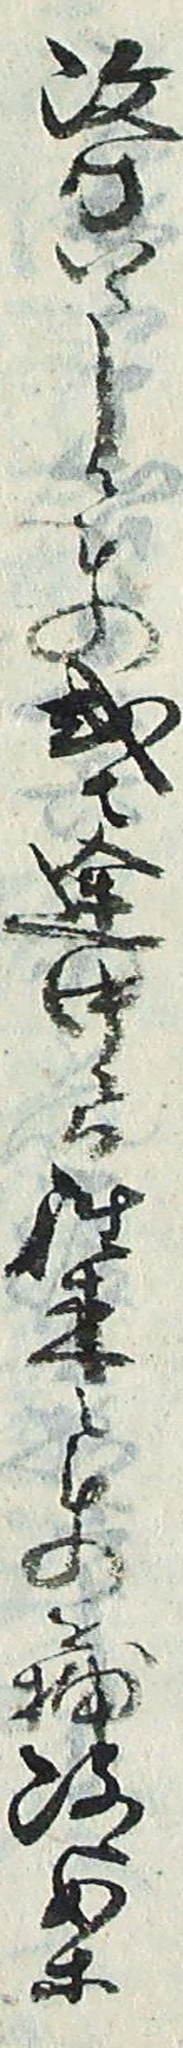改方いたし候もの或は途中に而往来之ものを捕改候義等
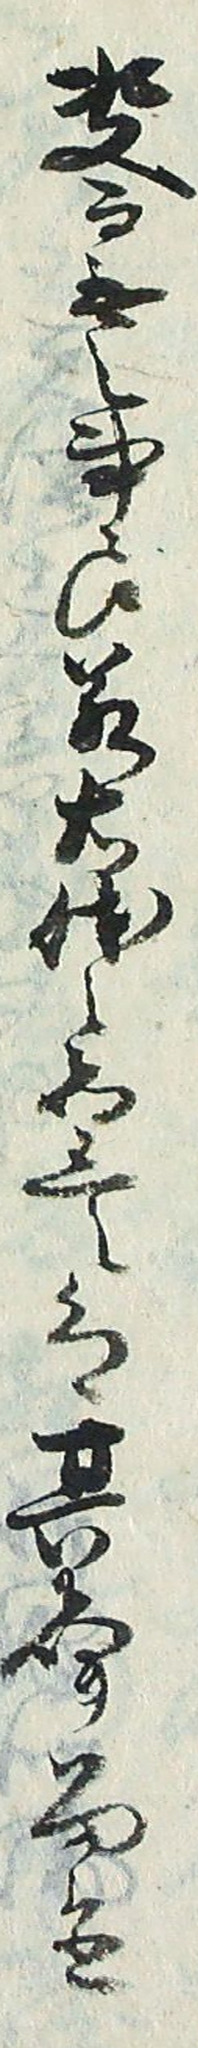決而無之事に候若右体之者有之候はゝ其者を留置
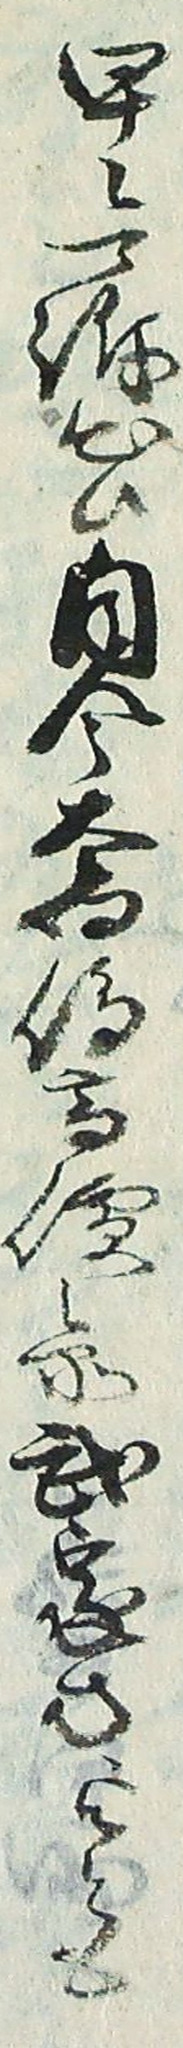早々可訴出候自今奢停侈高価之品武家方に候とも
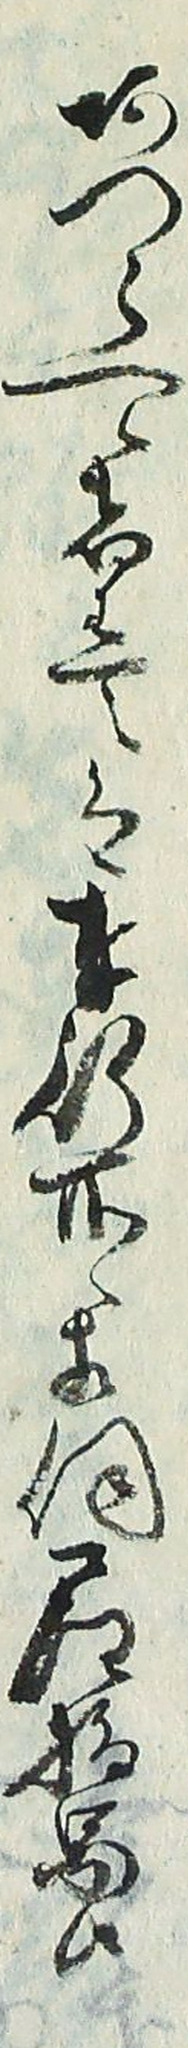あつらへ候者有之候はゝ奉行所へ相伺可任指図候
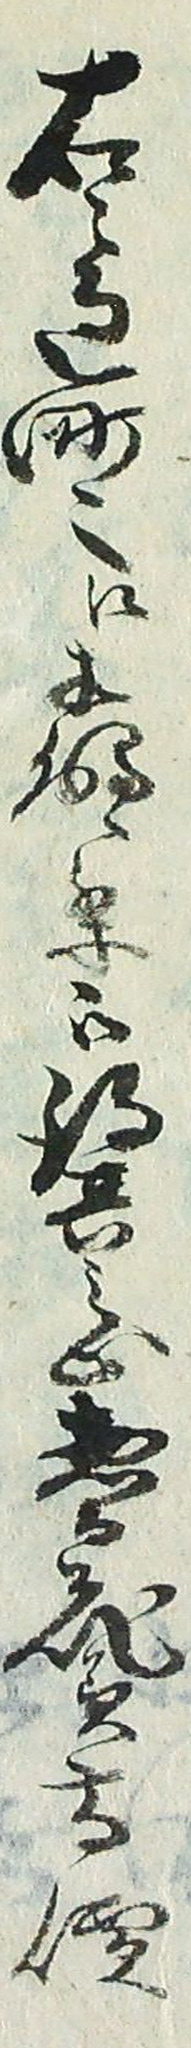右之通町々江相触候条被得其意惣而花美高価
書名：諸御用御□受書控
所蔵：鳴門教育大学 Naruto University of Education
